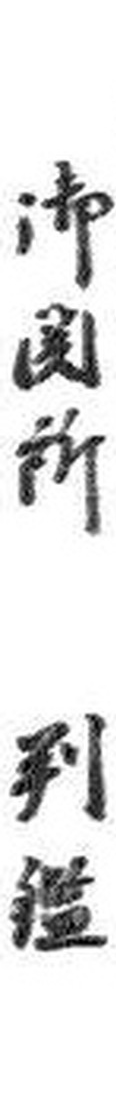御関所判鑑
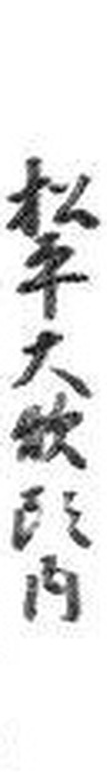松平大炊頭内
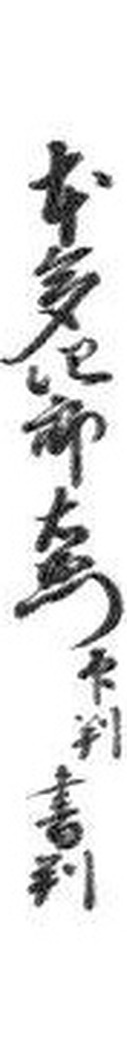本多四郎右衛門印判書判
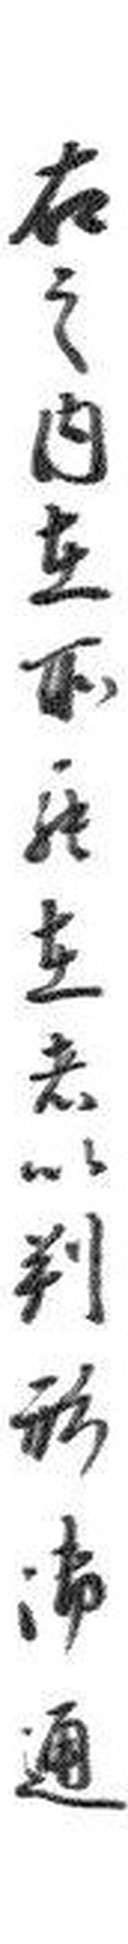右之内在所罷在者以判形御通

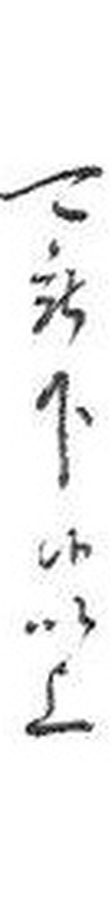可被下候以上
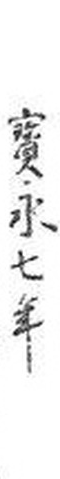宝永七年
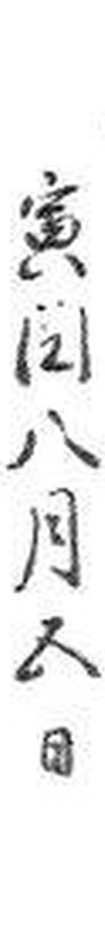寅閏八月五日
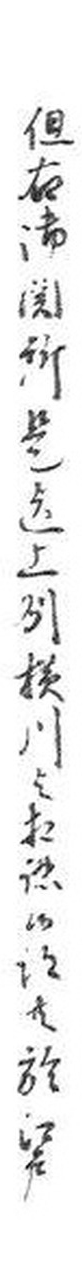但右御関所是迄上州横川与相認候得共於江戸
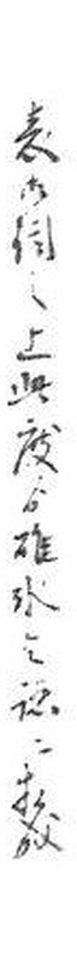表御伺之上此度ゟ碓氷与認ニ相成
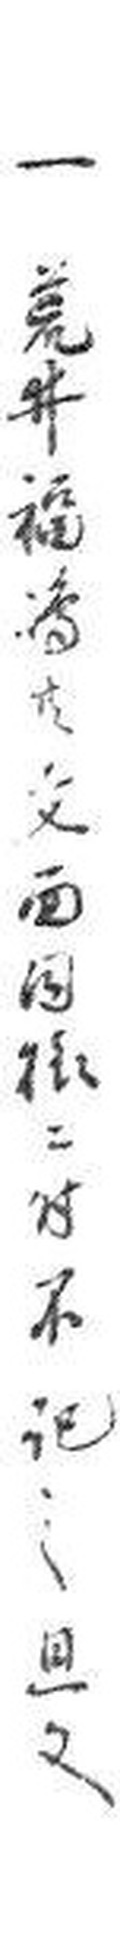一荒井福島共文面同様ニ付不記之且又
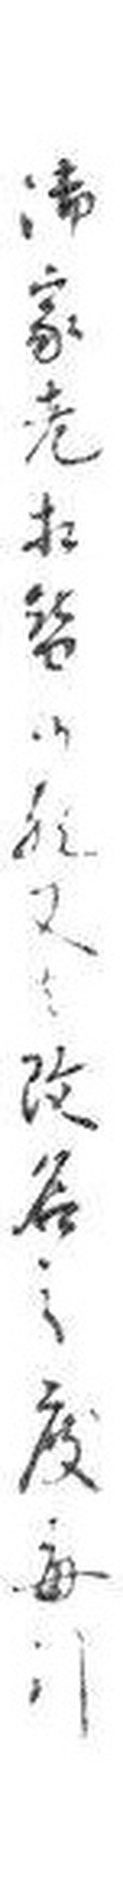御家老相替候歟又者改名之度毎引
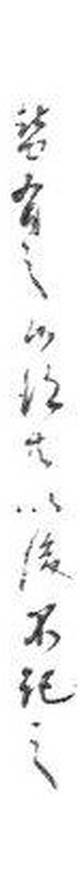替有之候得共以後不記之
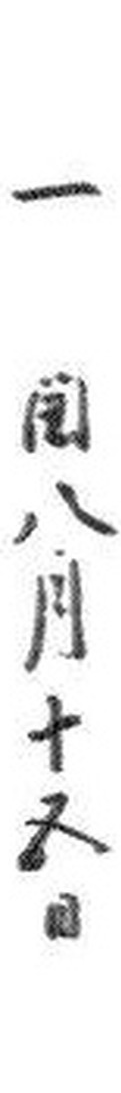一閏八月十五日
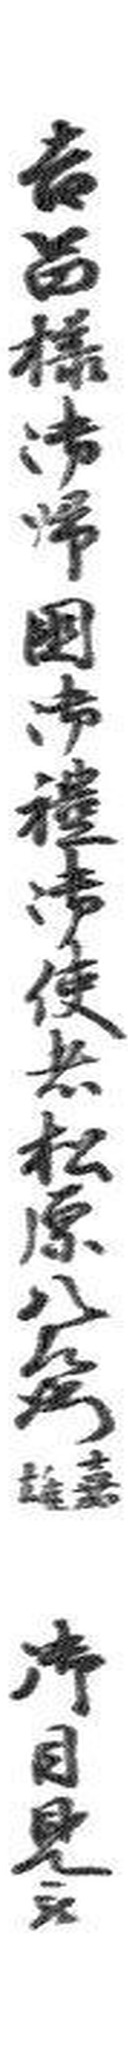吉品様御帰国御礼使者松原八左衛門嘉雄御目見被
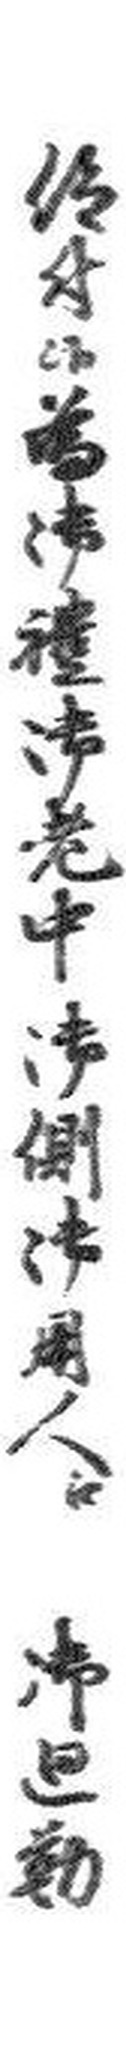仰付候為御礼御老中御側御用人江御廻勤
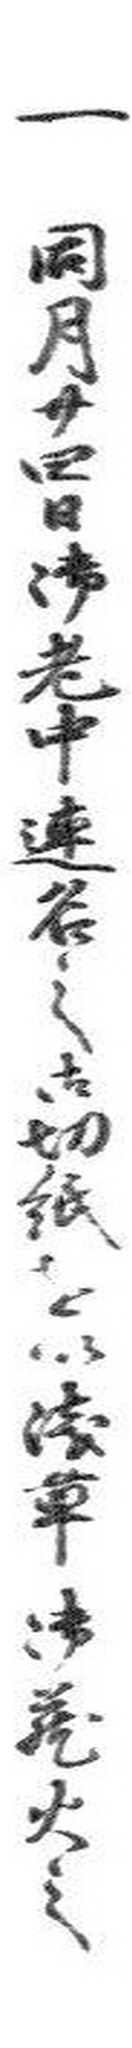一同月廿四日御老中連名之御切紙を以浅草御蔵火之
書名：家譜 二十八 吉邦公 従宝永七年七月五日到正徳元年十二月
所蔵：福井県文書館 Fukui Prefectural Archives
